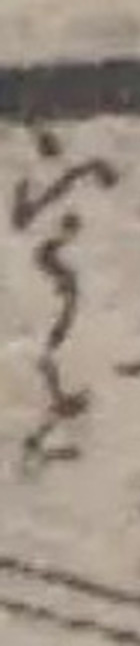らうと
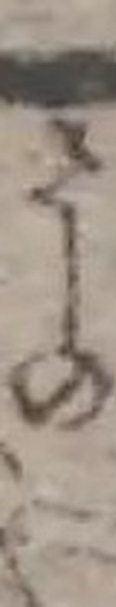さしの
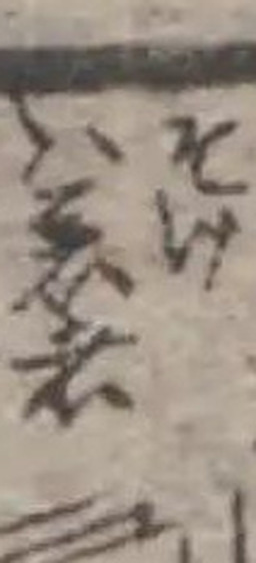は悪者
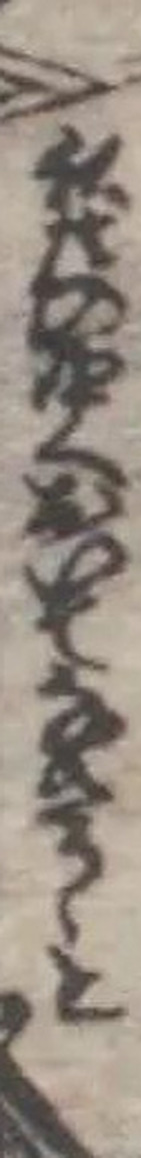私共の中へおいてなさるゝと
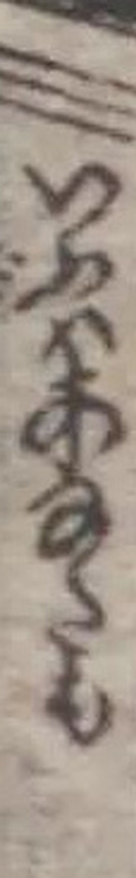いふはあなたも
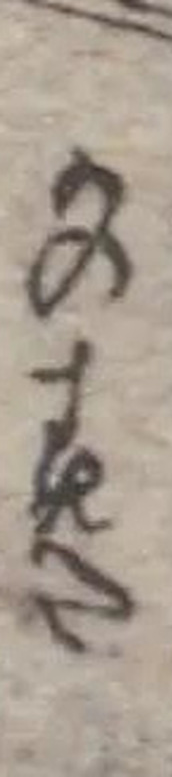ものすきた
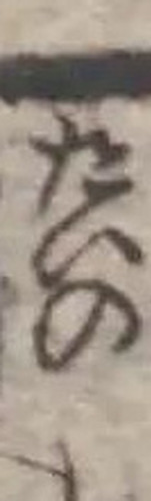たいの

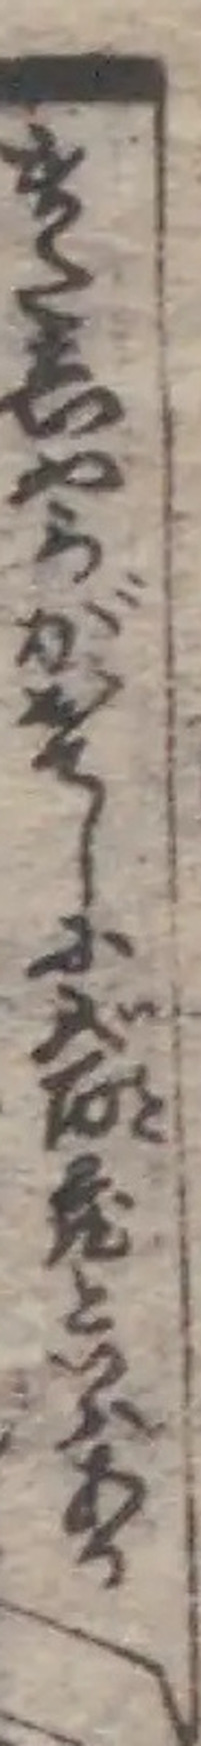またしやかがてしに五百蔵といふあり
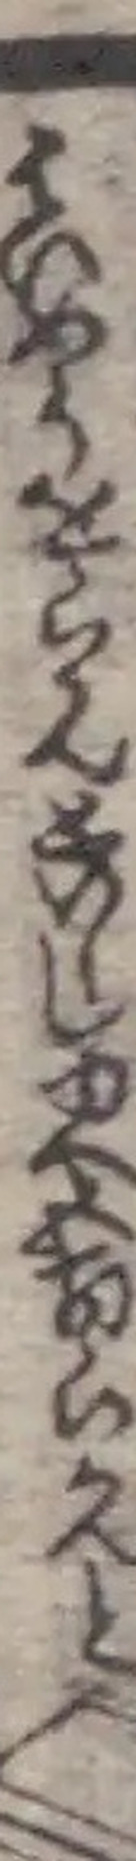はいめうをらかんといゝしゆへ五百らかんと
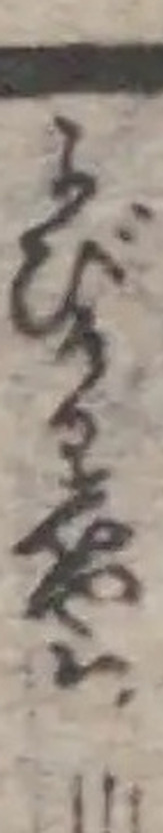よびけるしやか
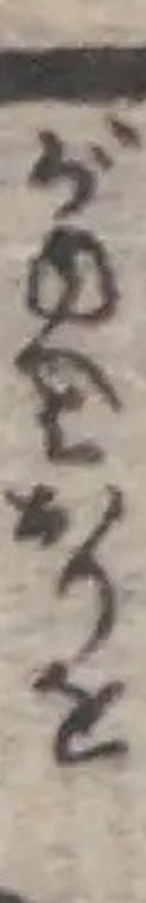がゆへはかりを
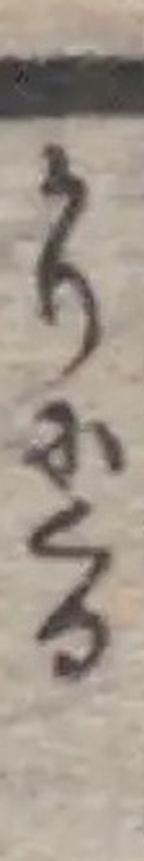うりにくる
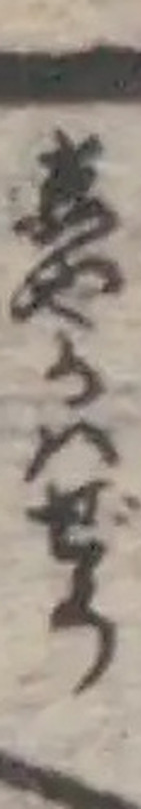しやかはぜう
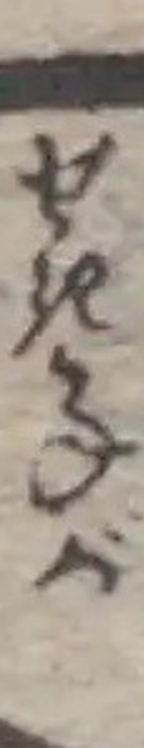せきかねが
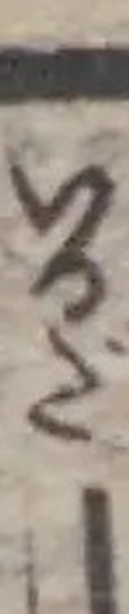いるだ
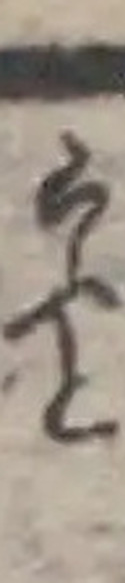らふと
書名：早出来 3巻
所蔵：国立国会図書館 National Diet Library, JAPAN
